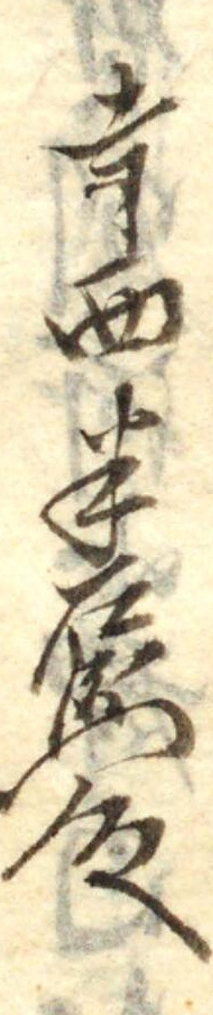寺西半右衛門殿
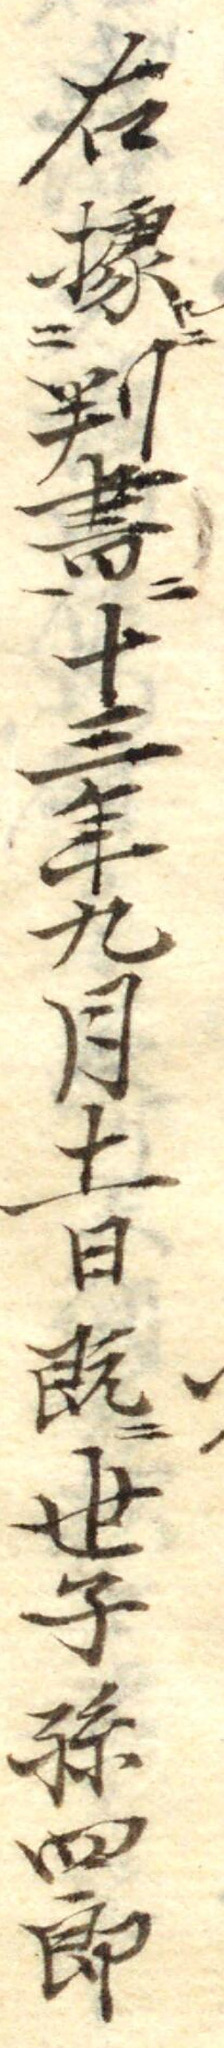右據るに判書に十三年九月十一日既に世子孫四郎
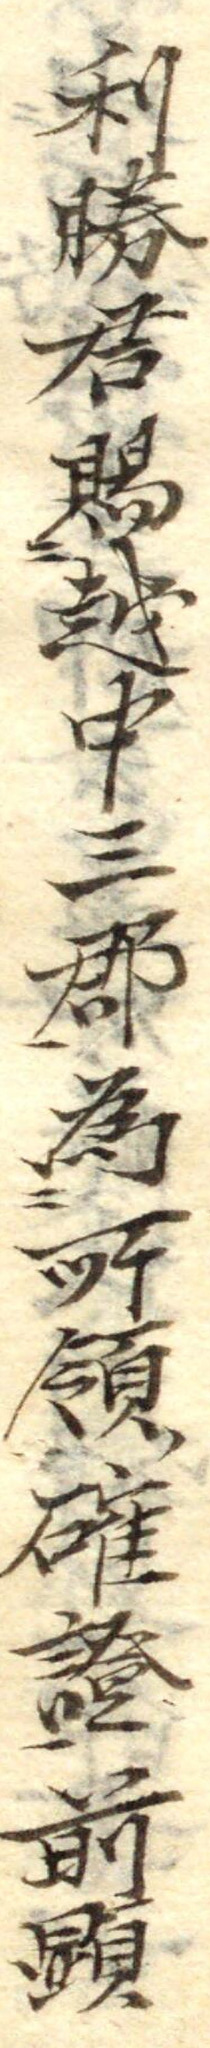利勝君賜越中三郡為所領の確證前顕
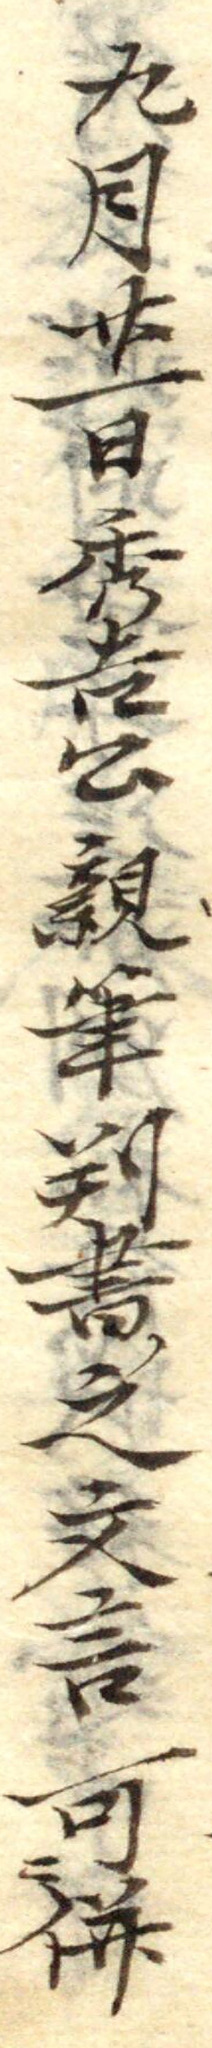九月廿一日秀吉公親筆判書之文言可併

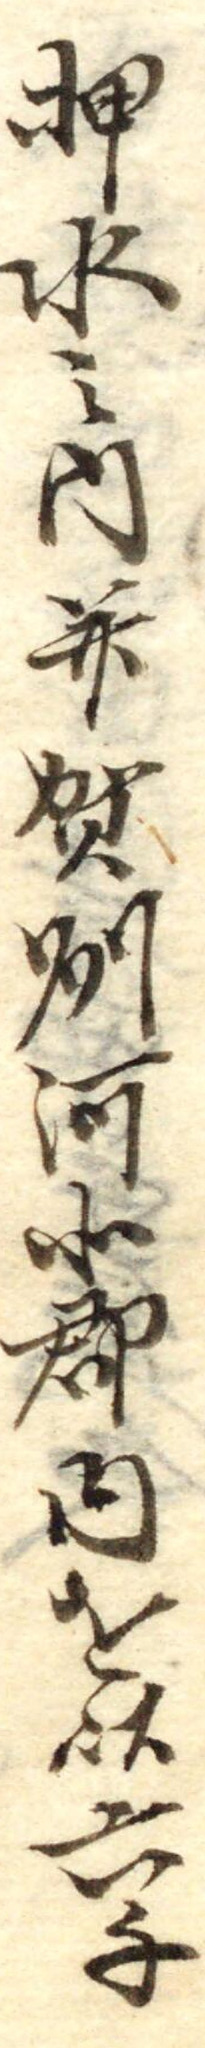押水之内幷賀州河北郡内を以六千
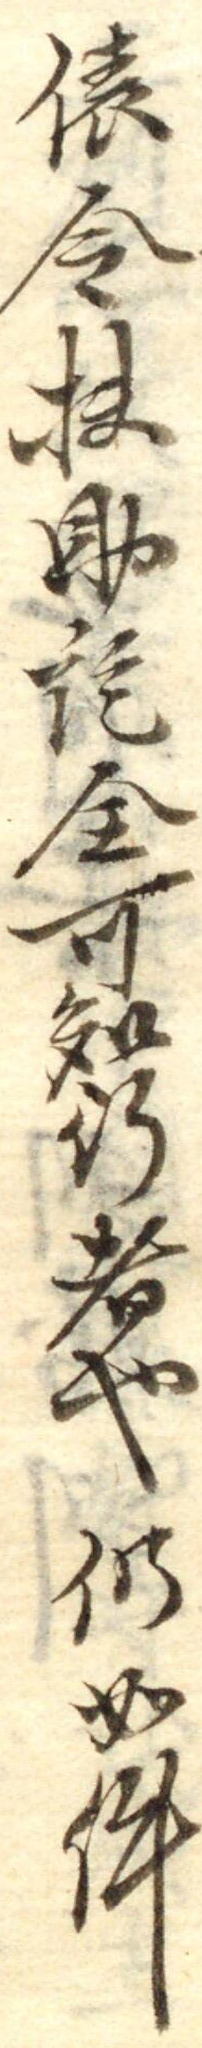俵令扶助訖全可知行者也仍如件
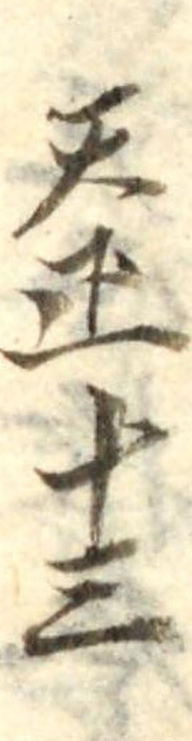天正十三
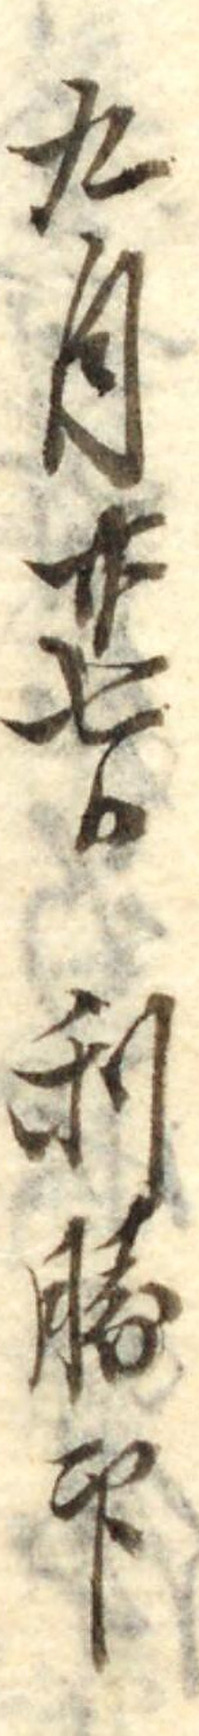九月廿七日利勝印
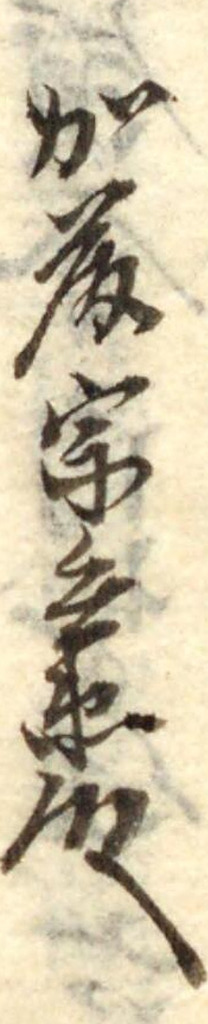加藤宗兵衛殿
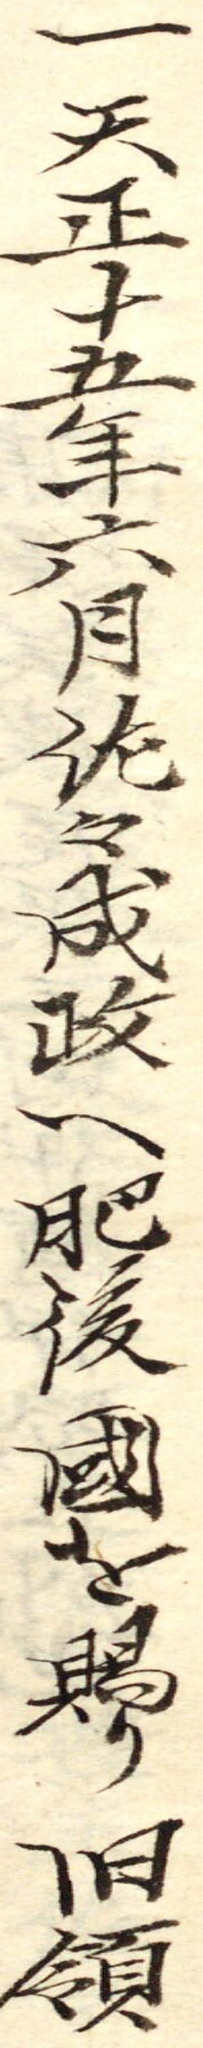一天正十五年六月佐々成政へ肥後国を賜り旧領
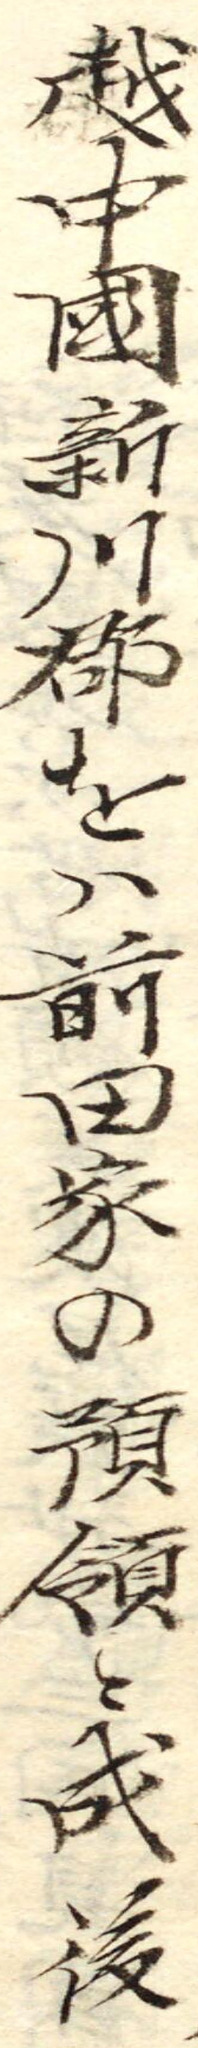越中国新川郡をは前田家の預領と成後
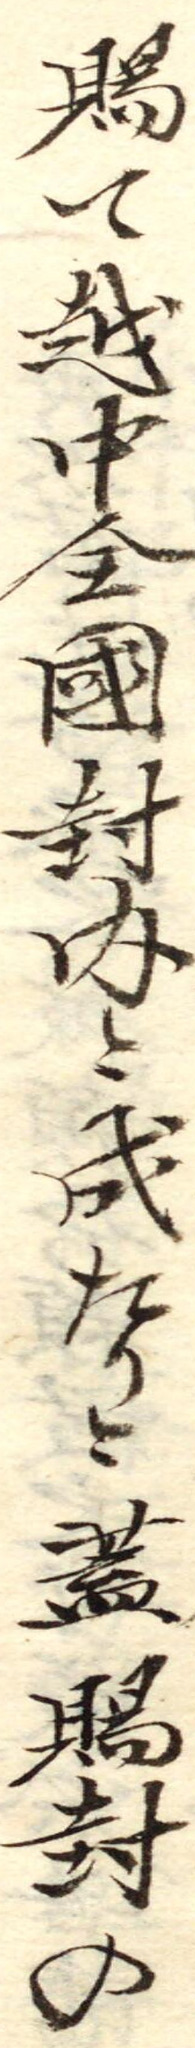賜て越中全国封内と成たりと蓋賜封の
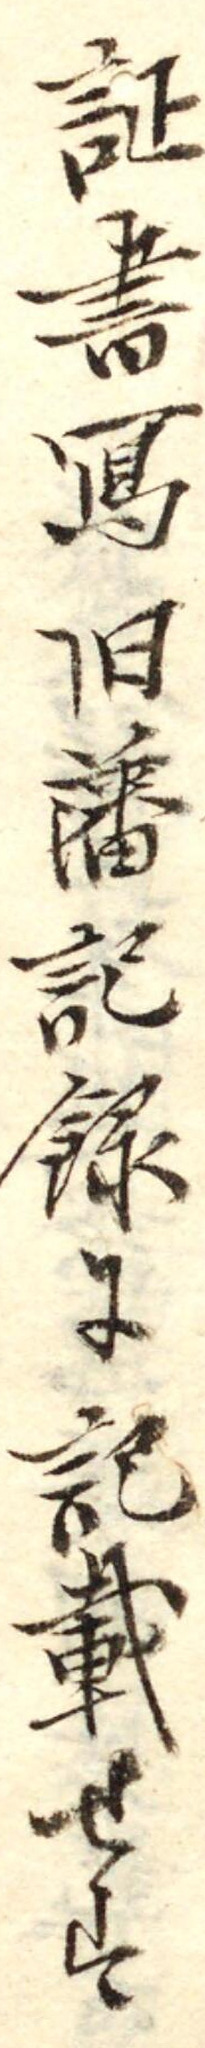証書写旧藩記録尓記載せ春
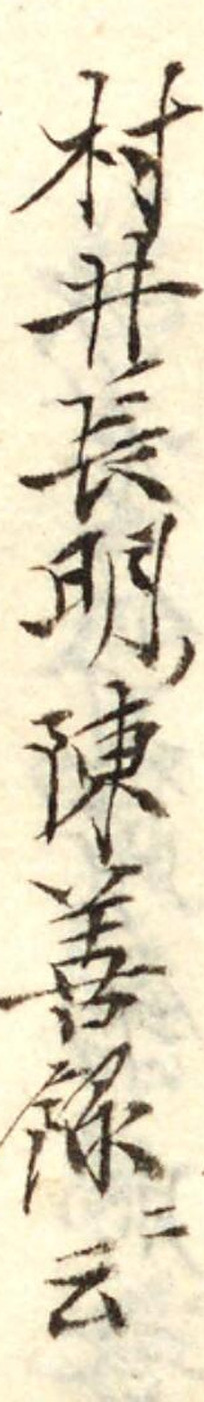村井長明の陳善録に云
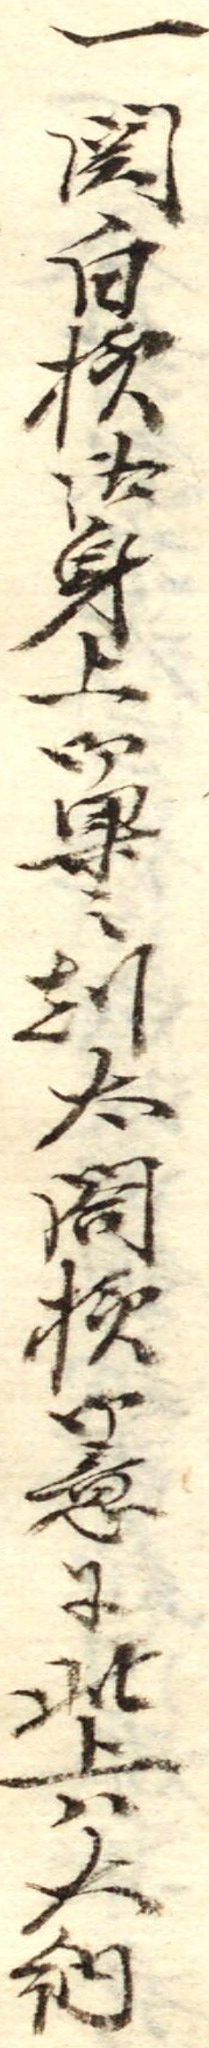一関白様御身上御果之刻太閤様御意尓此上大納
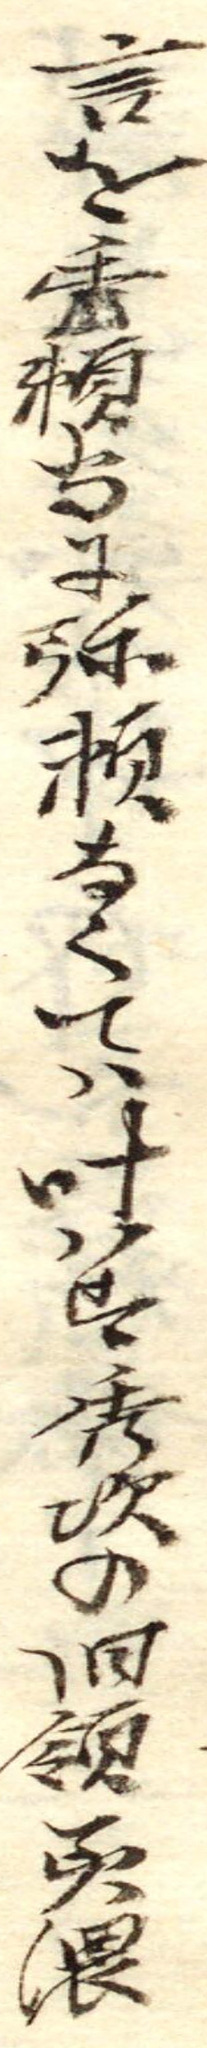言を秀頼守尓弥頼なくては叶は春秀次の旧領美濃
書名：前田家封国証書集録
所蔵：Ishikawa Prefectural Library
